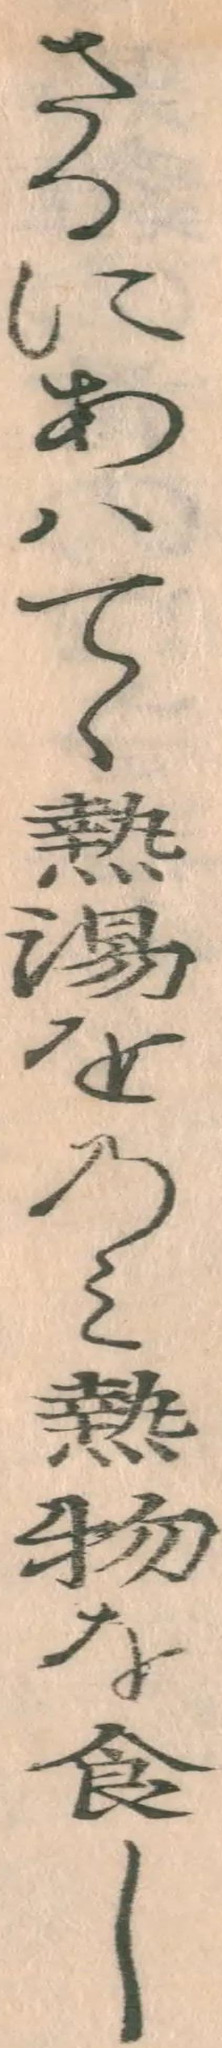さるにあはてゝ熱湯をのみ熱物を食し
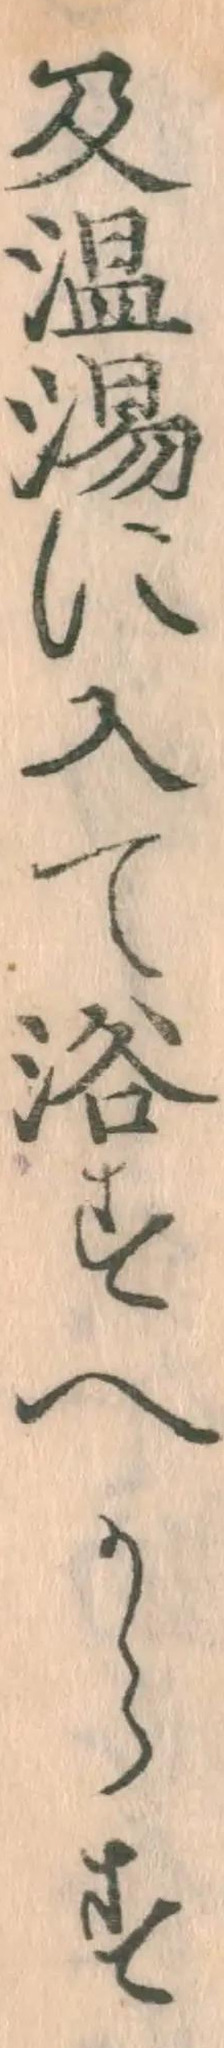及温湯に入て浴すへからす
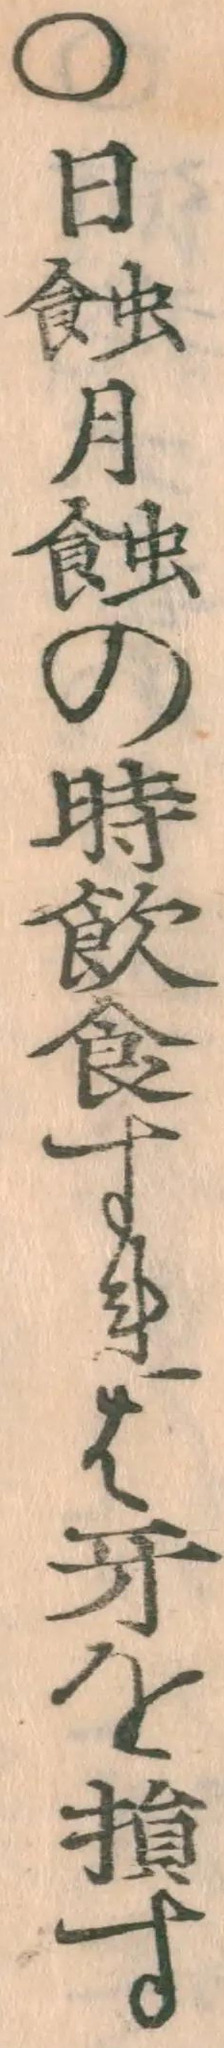〇日蝕月蝕の時飲食すれは牙そ損す
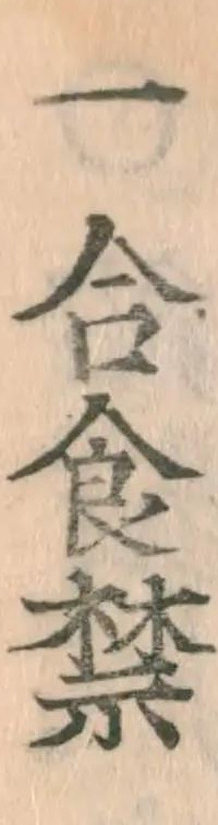一合食禁
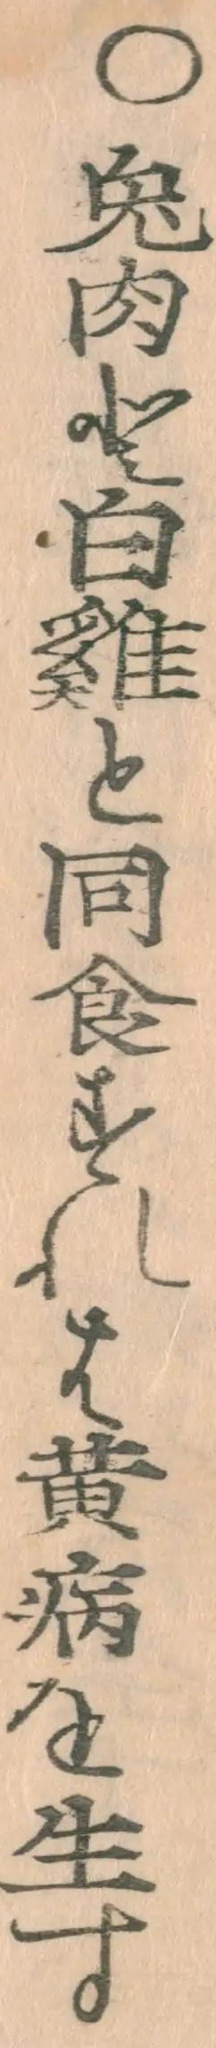〇兎肉と白鷄と同食すれは黄病を生す
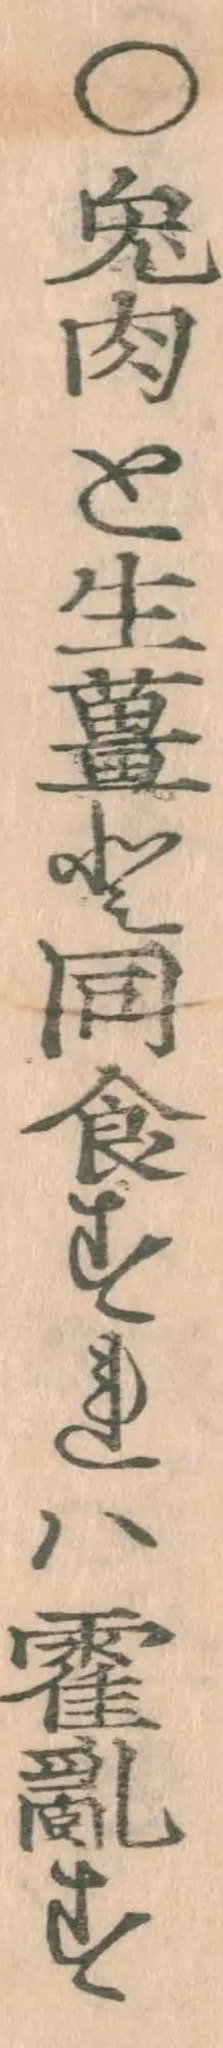〇兎肉と生薑と同食すれは霍乱す
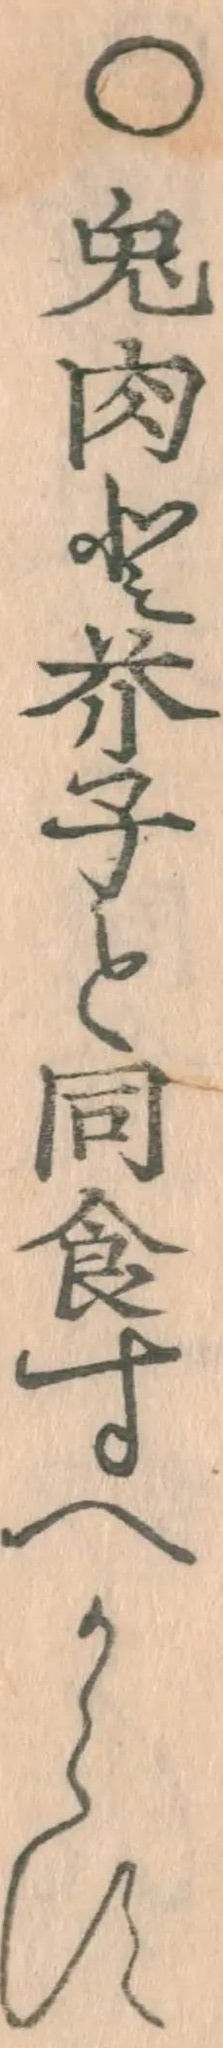〇兎肉と芥子と同食すへからす
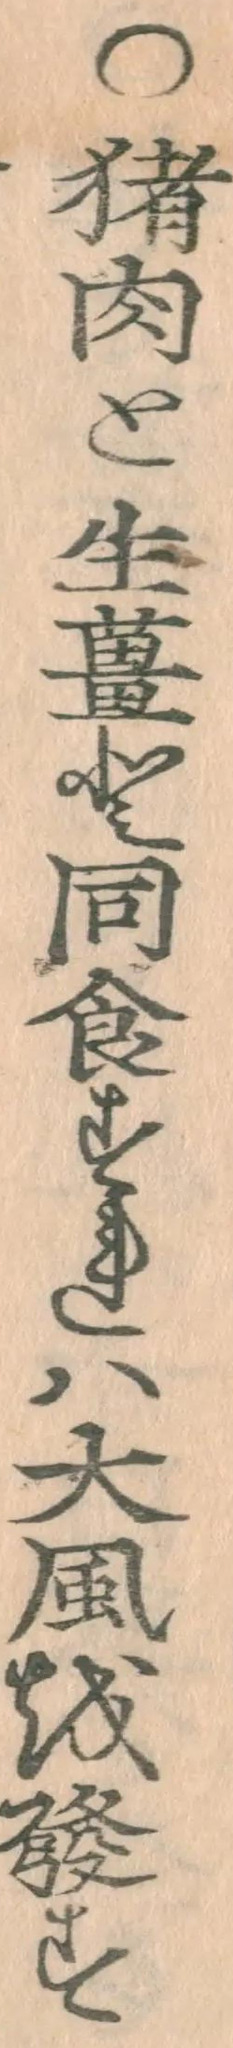〇猪肉と生薑と同食すれは大風を発す
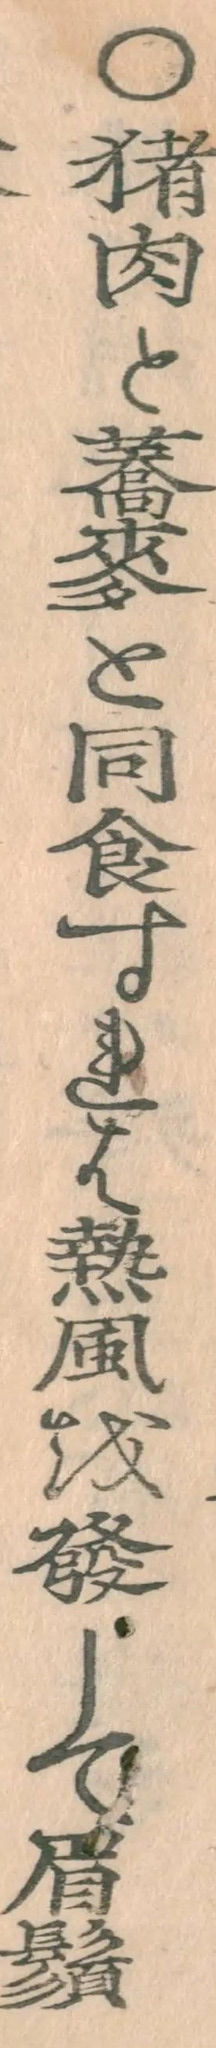〇猪肉と蕎麦と同食すれは熱風を発して眉鬚
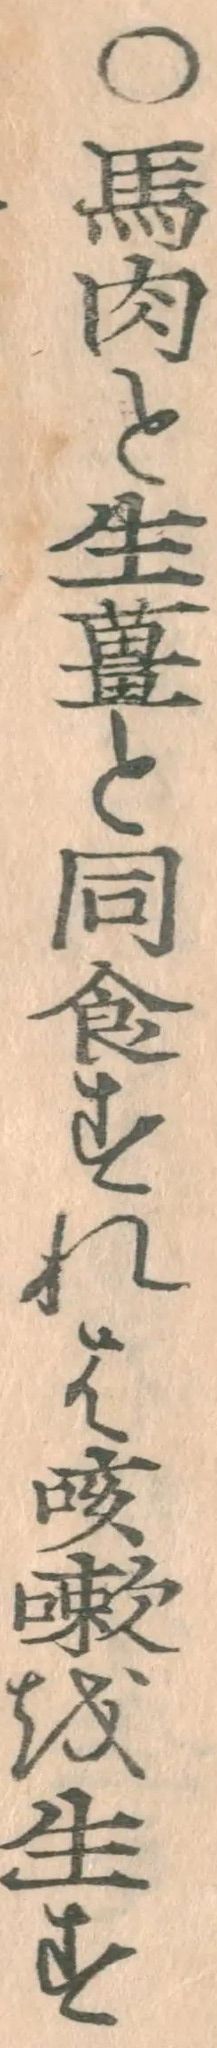〇馬肉と生薑と同食すれは咳嗽を生す
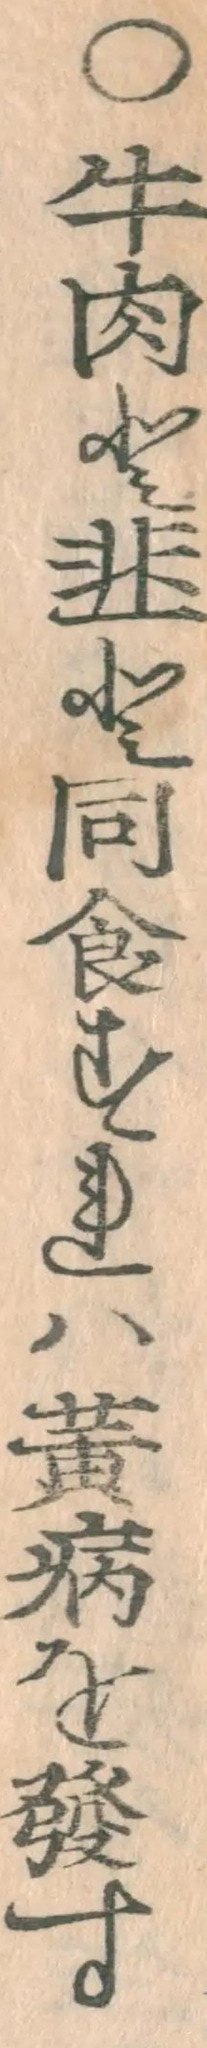〇牛肉と韮と同食すれは黄病を発す
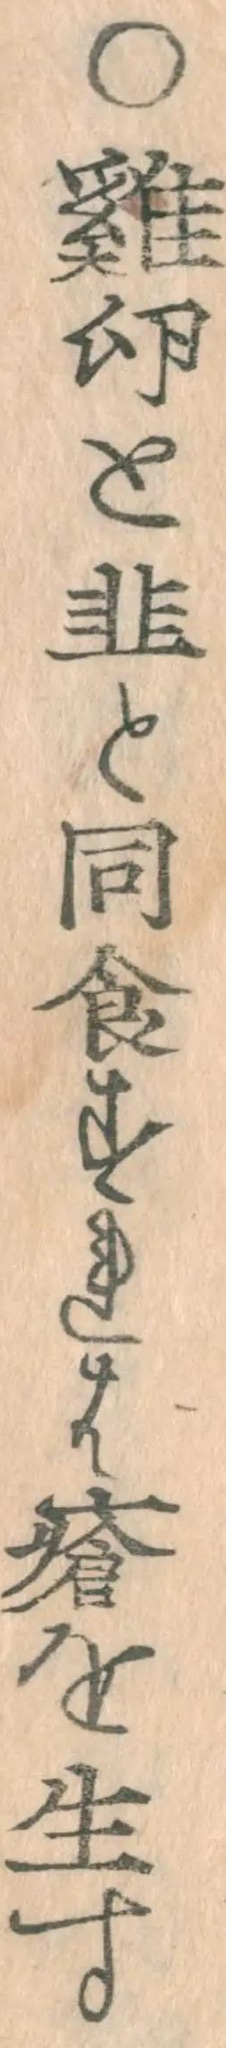〇鶏卵と韮と同食すれは瘡を生す

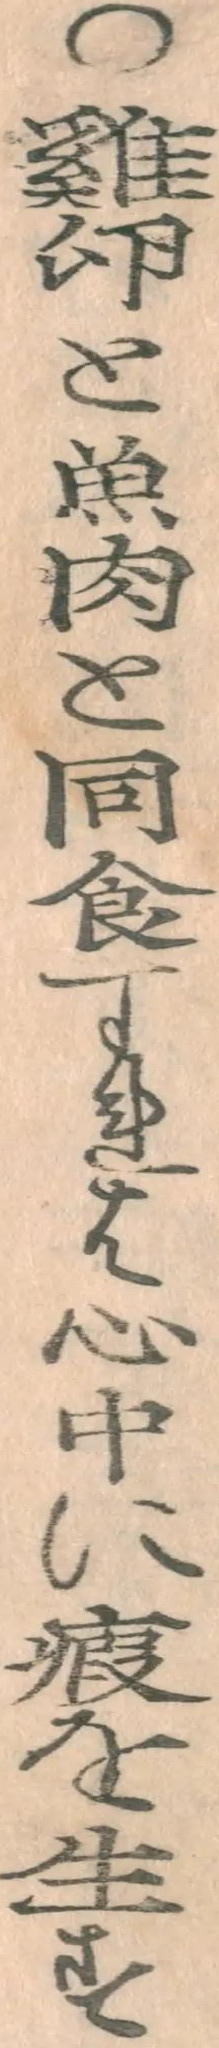〇鶏卵と魚肉と同食すれは心中に瘕を生す
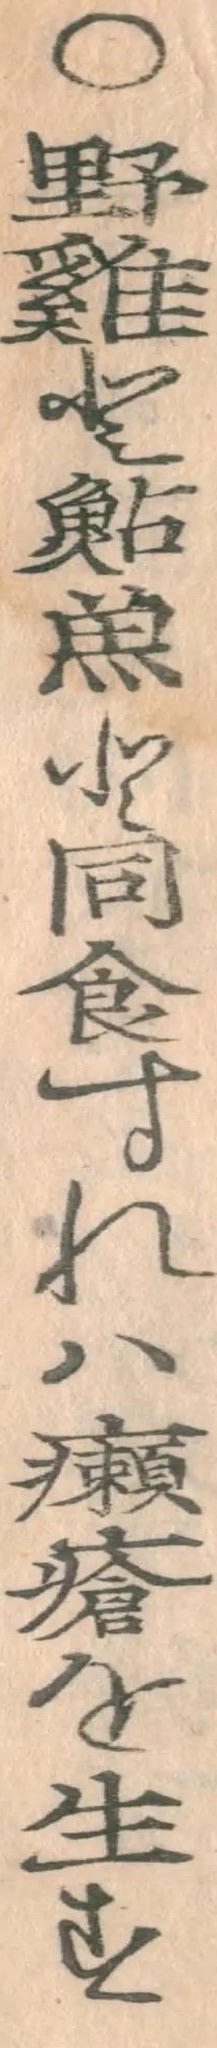〇野鷄と鮎魚と同食すれは癩瘡を生す
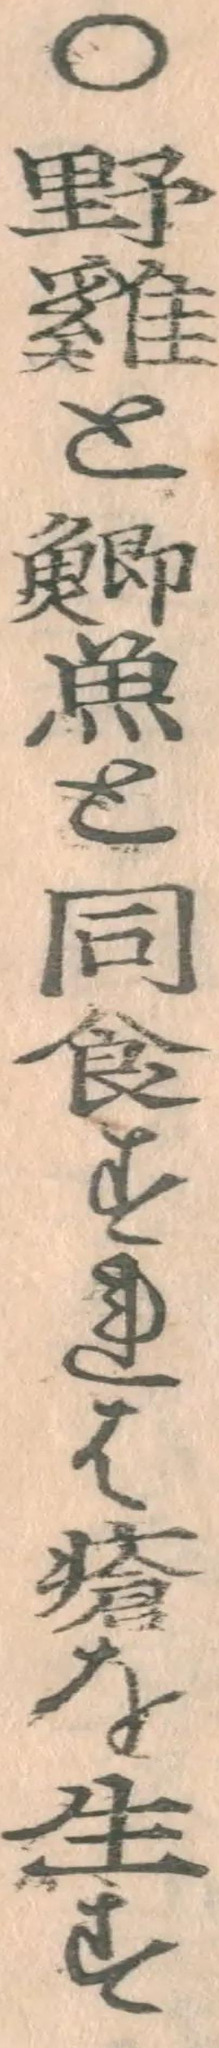〇野鷄と鯽魚と同食すれは瘡を生す
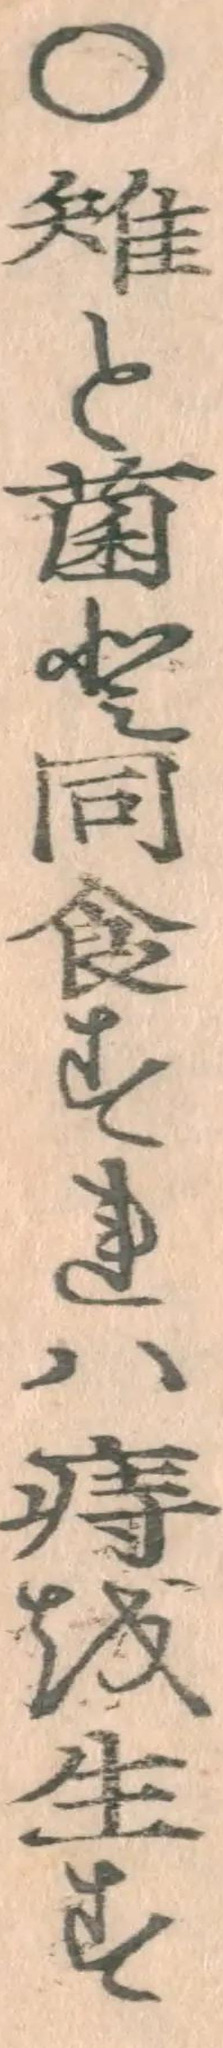〇雉と菌と同食すれは痔を生す
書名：延壽撮要
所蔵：国立国会図書館 National Diet Library, JAPAN
